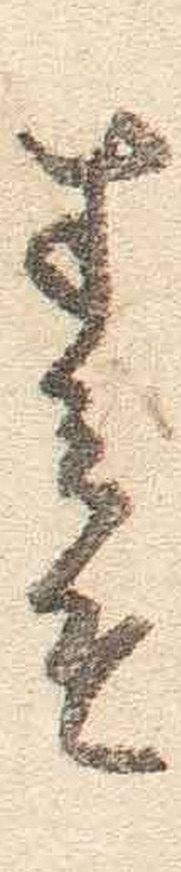すみそ

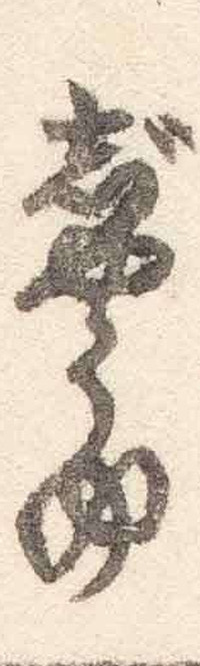じやうゆ
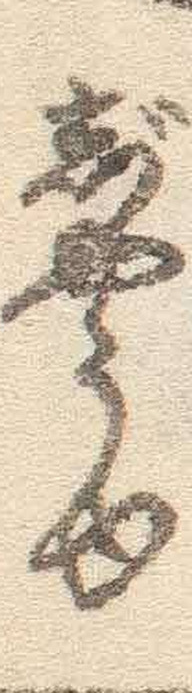じやうゆ

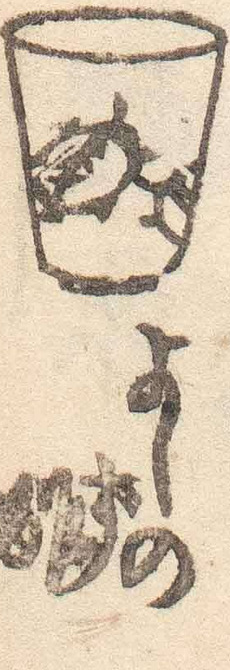よしの
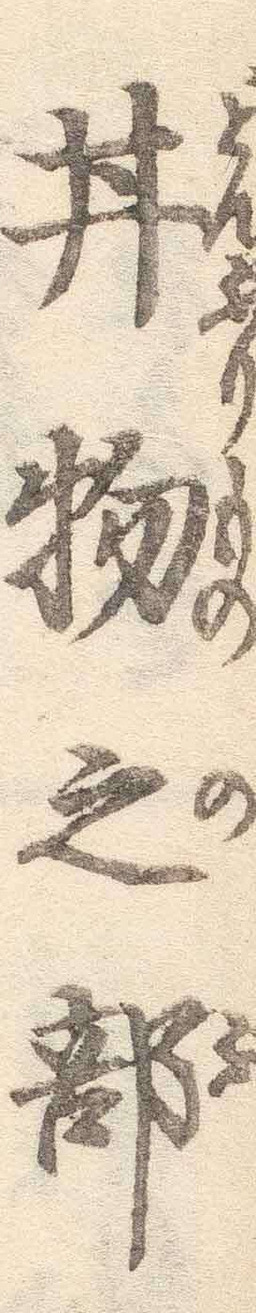丼物之部
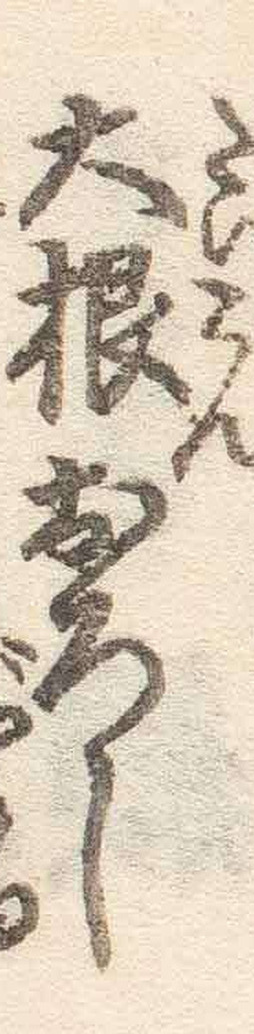大根おろし
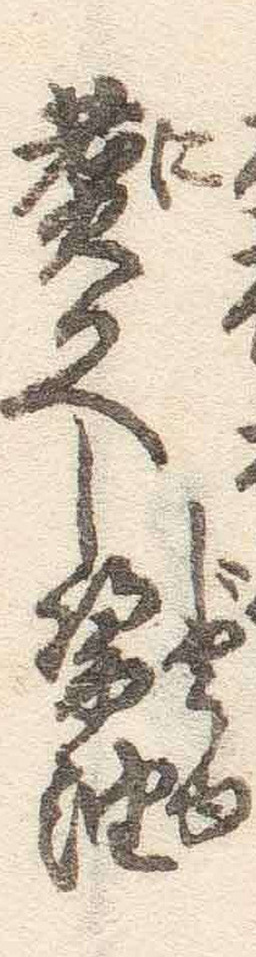煮かへし醤油
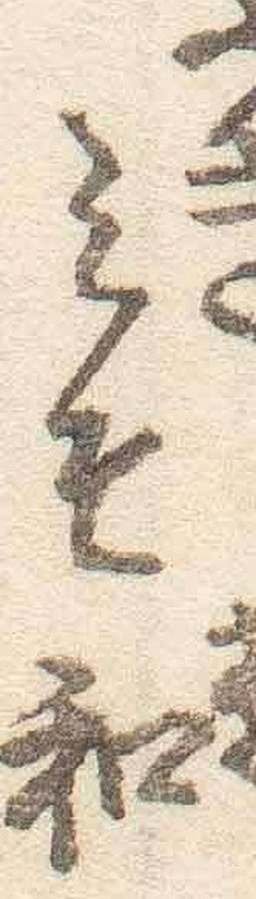みそ和
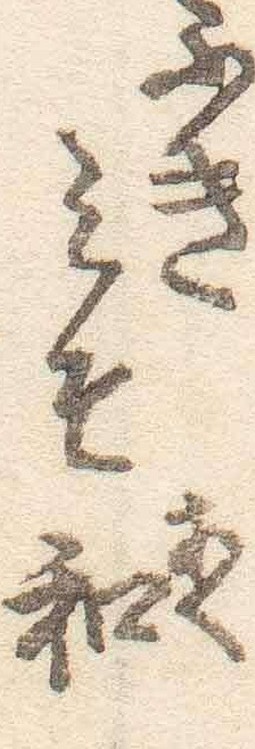みそ和
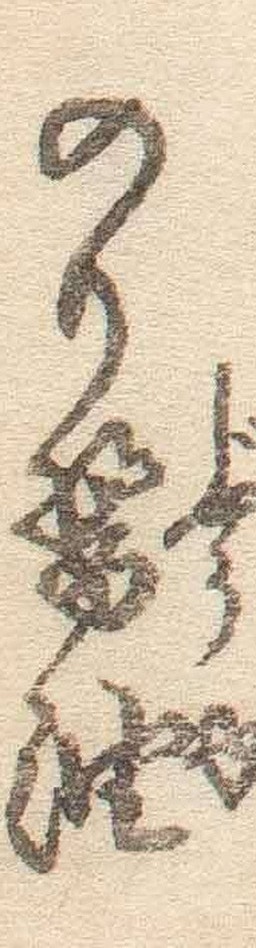のり醤油

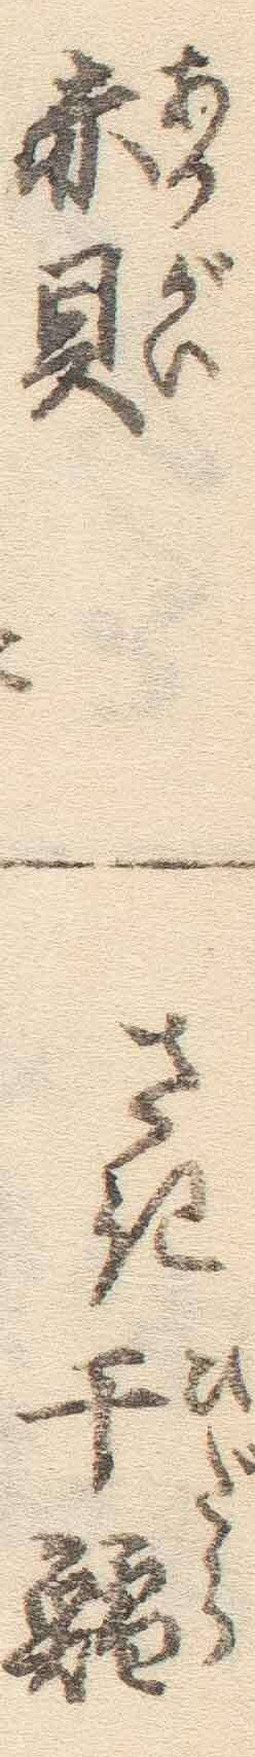赤貝さき干鱈
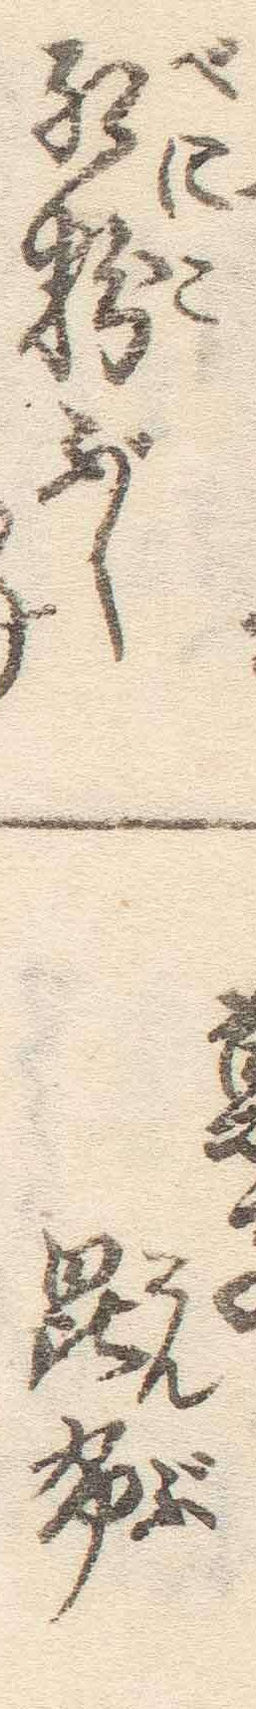紅粉ぶし昆布
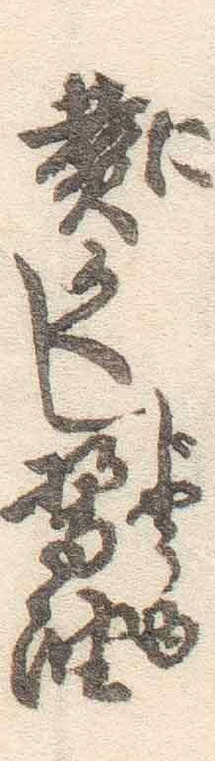煮かへし醤油煮
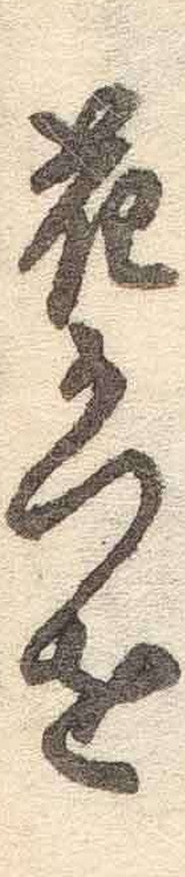花かつを
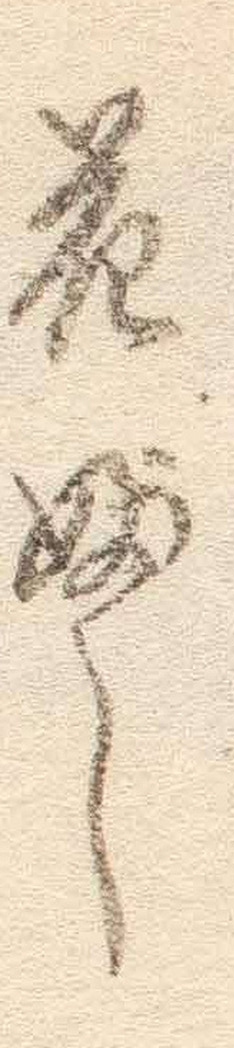花ぶし
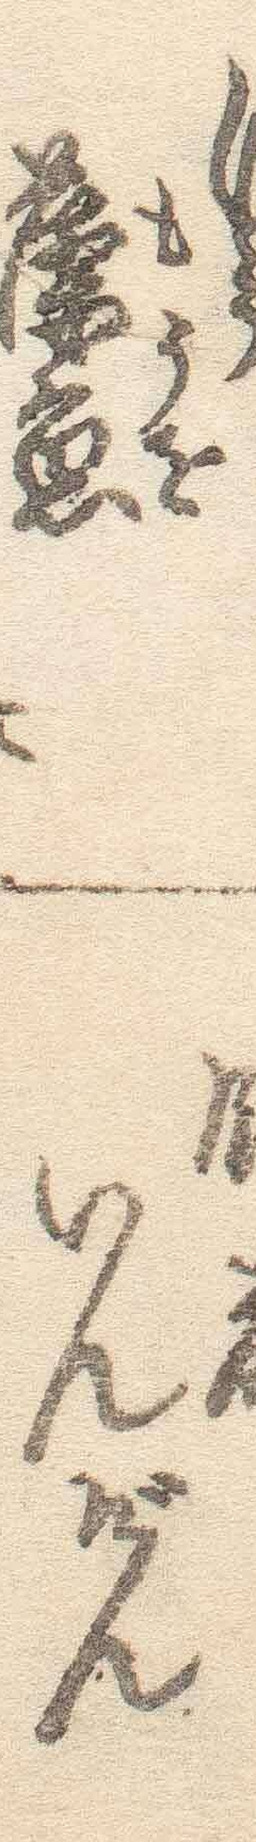藻魚いんげん
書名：料理通
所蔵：東京学芸大学附属図書館 国文学研究資料館
